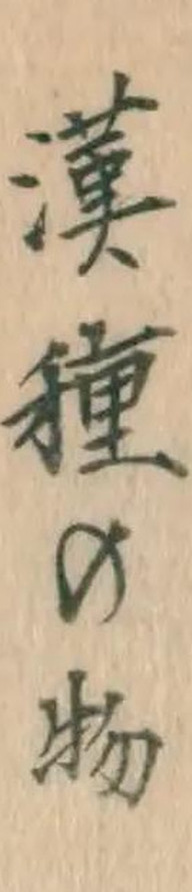漢種の物
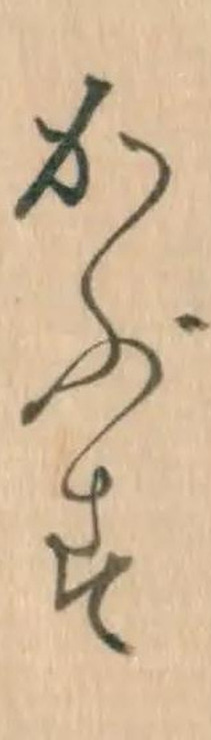かぶす

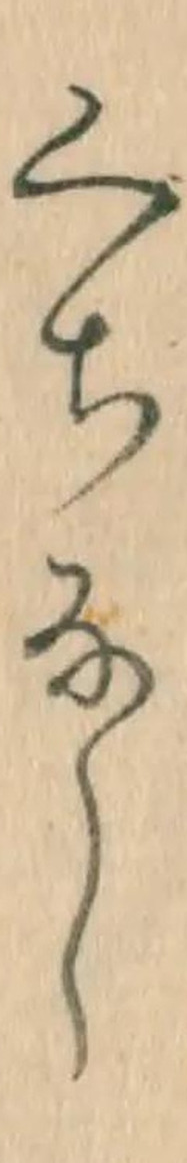くちなし

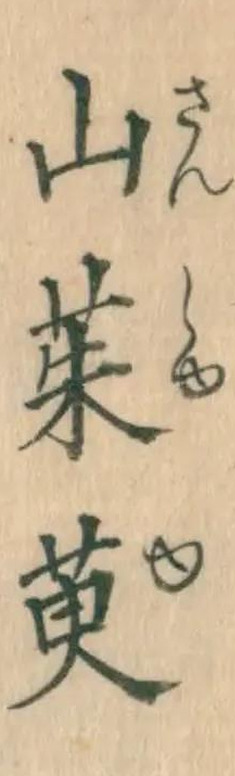山茱萸
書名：本草図譜. 巻85-87
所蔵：国立国会図書館 National Diet Library, JAPAN
